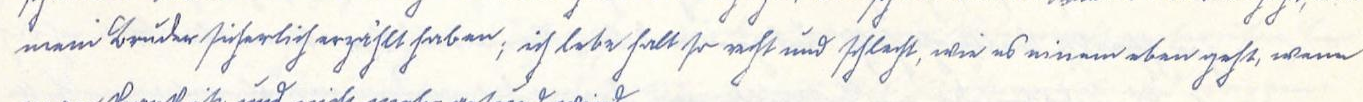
mein Bruder sicherlich erzählt haben; ich lebe halt so recht und schlecht, wie es einem eben geht, wenn
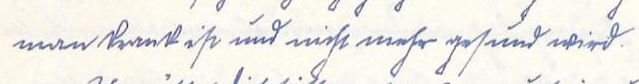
man krank ist und nicht mehr gesund wird.
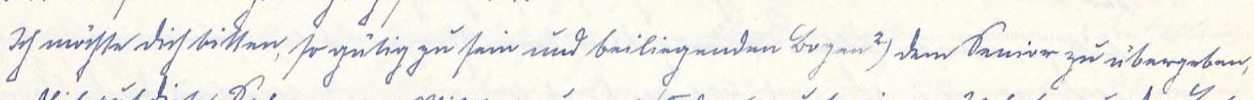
Ich möchte dich bitten, so gütig zu sein und beiliegenden Bogen 2) dem Senior zu übergeben,
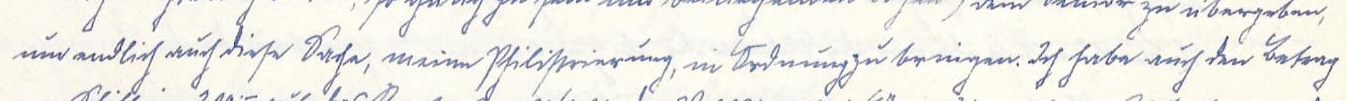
um endlich auch diese Sache, meine Philistrierung, in Ordnung zu bringen. Ich habe auch den Betrag
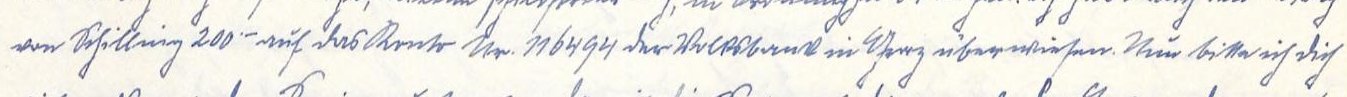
von Schilling 200- auf das Konto Nr. 116494 der Volksbank in Graz überwiesen. Nun bitte ich dich
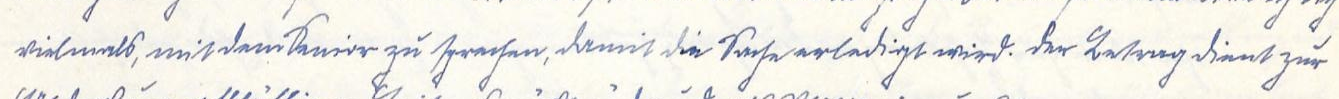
vielmals, mit dem Senior zu sprechen, damit die Sache erledigt wird. Der Betrag dient zur
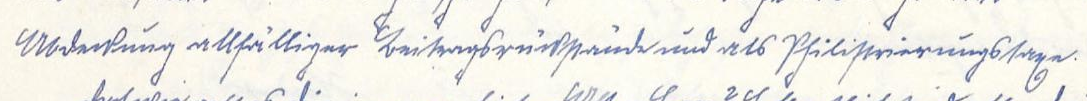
Abdeckung allfälliger Beitragsrückstände und als Philistrierungstaxe.
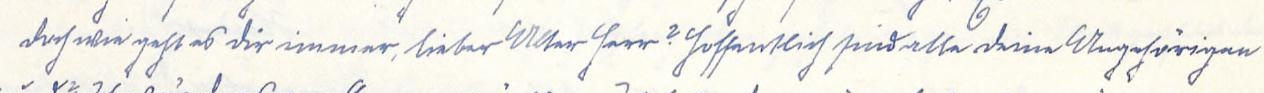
Doch wie geht es dir immer, lieber Alter Herr? Hoffentlich sind alle deine Angehörigen
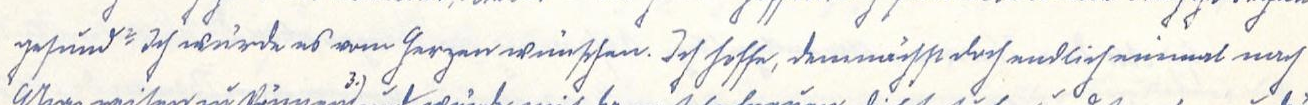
gesund? Ich würde es vo Herzen wünschen. Ich hoffe, demmächst doch endlich einmal nach
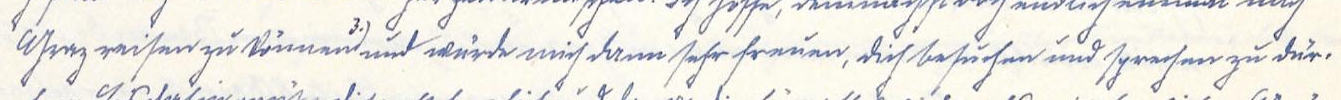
Graz reisen zu können.3) Ich würde mich dann sehr- freuen, dich besuchen und sprechen zu dür-
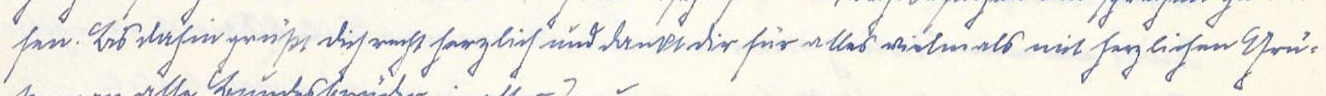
fen. Bis dahin grüßt dich recht herzlich und dankt Dir für alles vielmals mit herzlichen Grü-
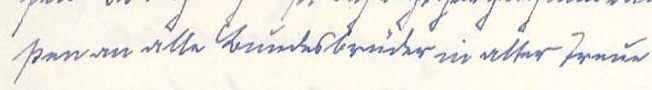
ßen an alle Bundesbrüder in alter Treue
